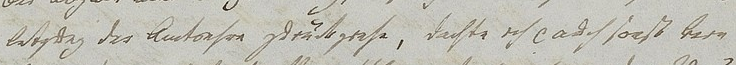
letzung der Amtsehre zurückziehe, dachte ich & auch sonst kein
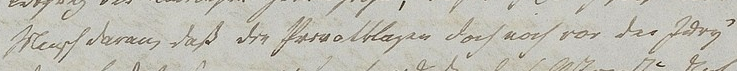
Mensch daran, daß die Privatklagen doch noch vor der Jury
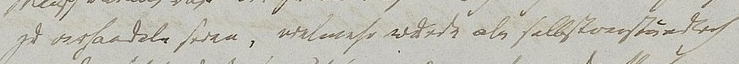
zu verhandeln seien, vielmehr wurde als selbstverständlich
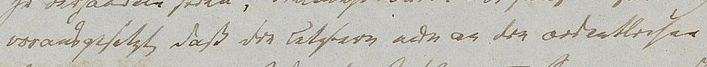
vorausgesetzt, daß die letztern nun an die ordentlichen
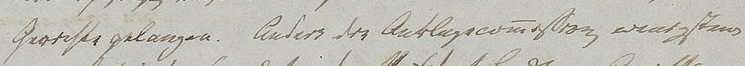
Gerichte gelangen. Anders die Anklagscommission, wenigstens
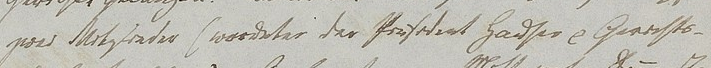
zwei Mitglieder (worunter der Präsident Hauser & Gerichts-
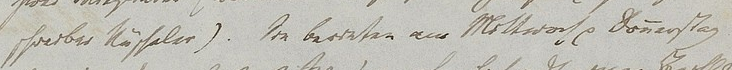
schreiber Nüscheler ). Sie berieten am Mittwoch & Donnerstag
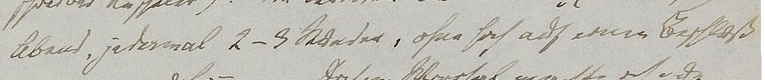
Abend, jedesmal 2–3 Stunden, ohne sich auf einen Beschluß
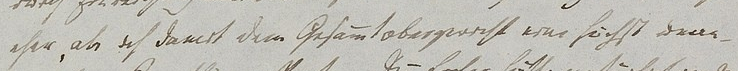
eher, als ich damit dem Gesammtobergericht eine höchst unan-
